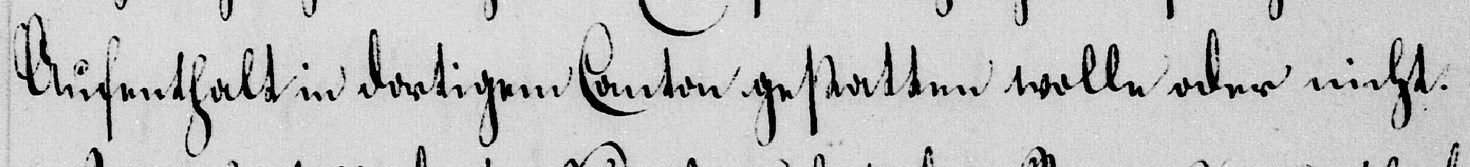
Aufenthalt in dortigem Canton gestatten wolle oder nicht.
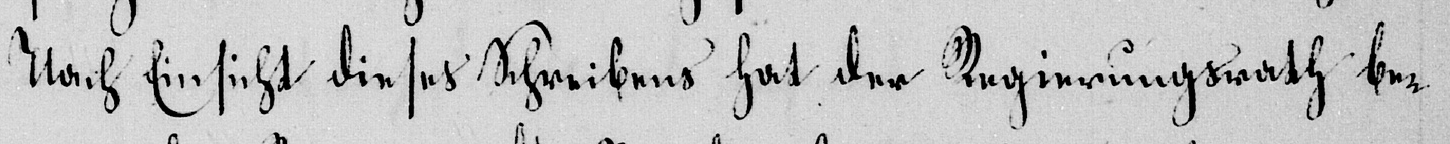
Nach Einsicht dieses Schreibens hat der Regierungsrath be¬
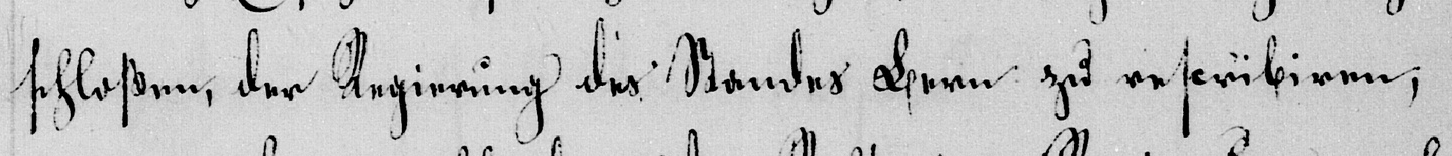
schloßen, der Regierung des Standes Bern zu rescribiren,
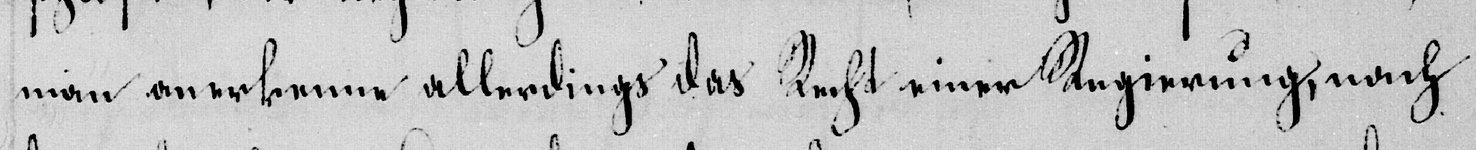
man anerkenne allerdings das Recht einer Regierung, nach
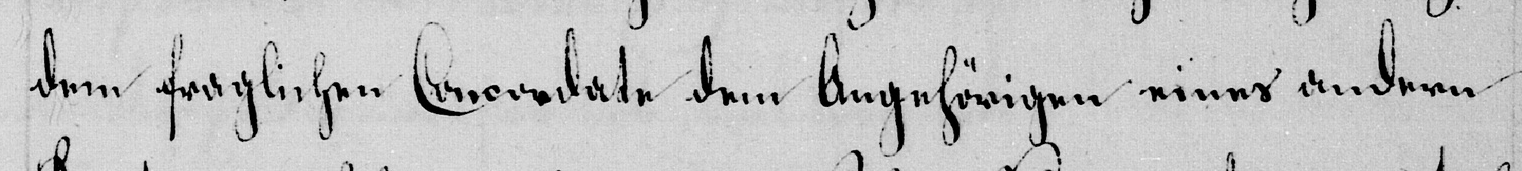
dem fraglichen Concordate dem Angehörigen eines andern
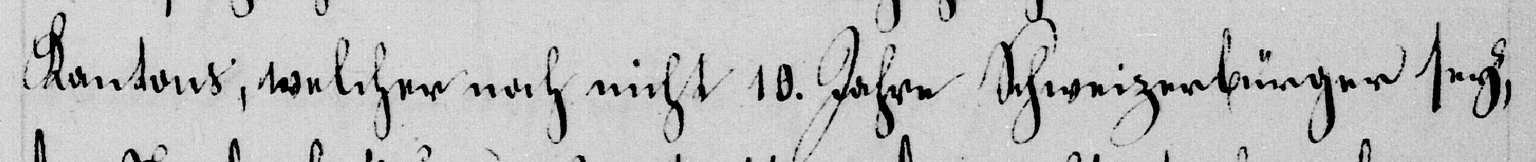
Kantons, welcher noch nicht 10. Jahre Schweizerbürger sey,
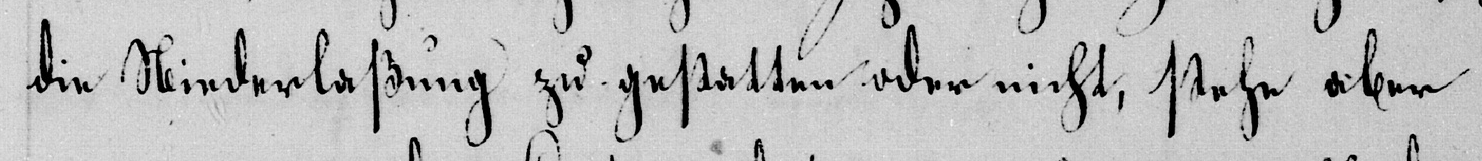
die Niederlaßung zu gestatten oder nicht, stehe aber
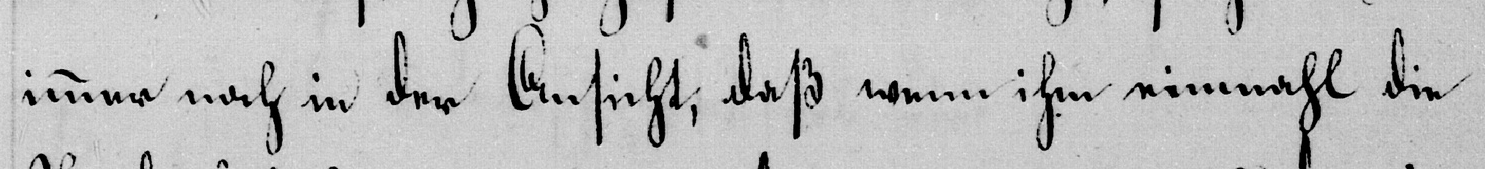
immer noch in der Ansicht, daß wenn ihm einmahl die
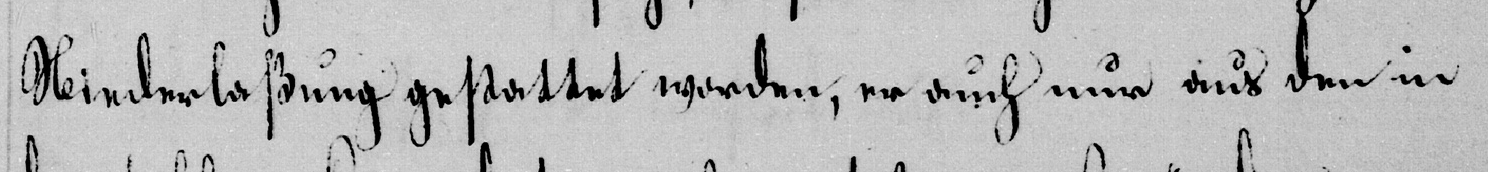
Niederlaßung gestattet worden, er auch nur aus den in
